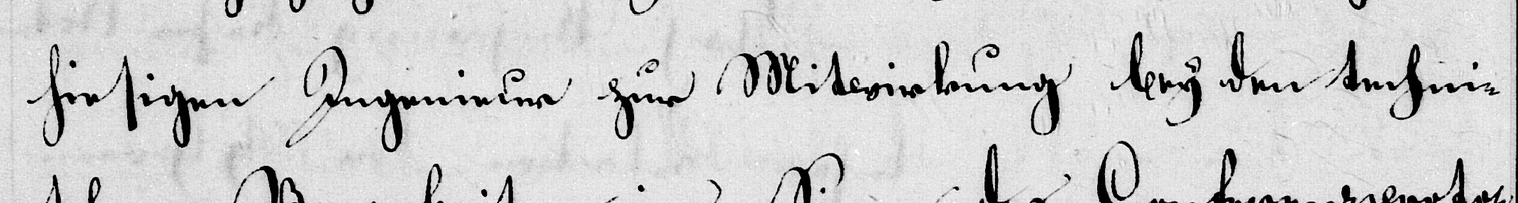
hiesigen Ingenieur zur Mitwirkung bey den techni¬
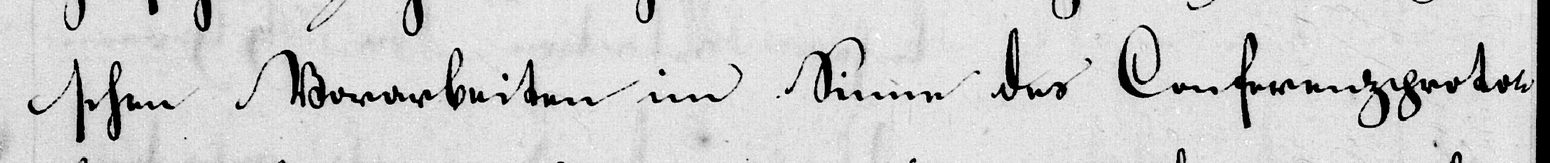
schen Vorarbeiten im Sinne des Conferenzproto¬
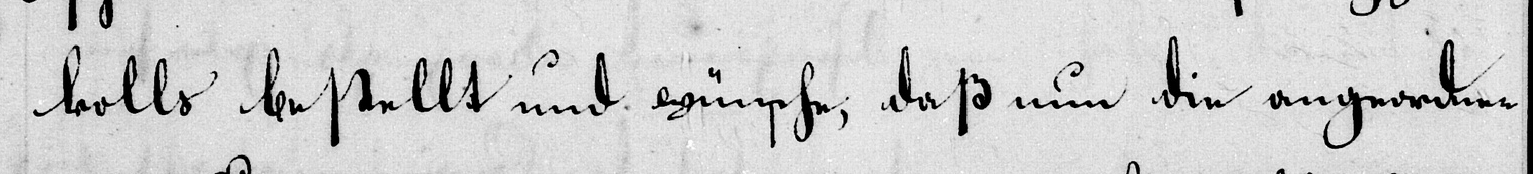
kolls bestellt und wünsche, daß nun die angeordne¬
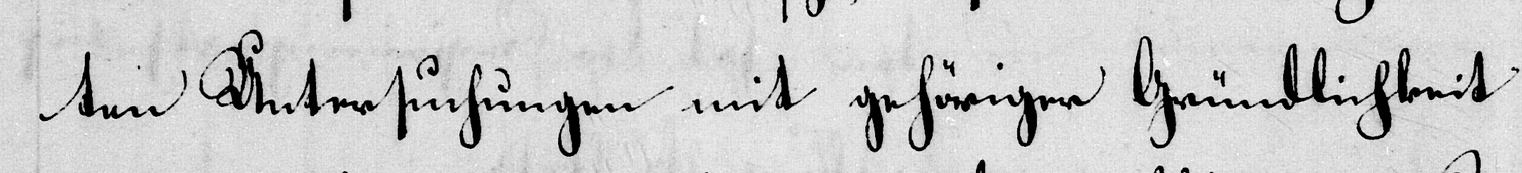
ten Untersuchungen mit gehöriger Gründlichkeit
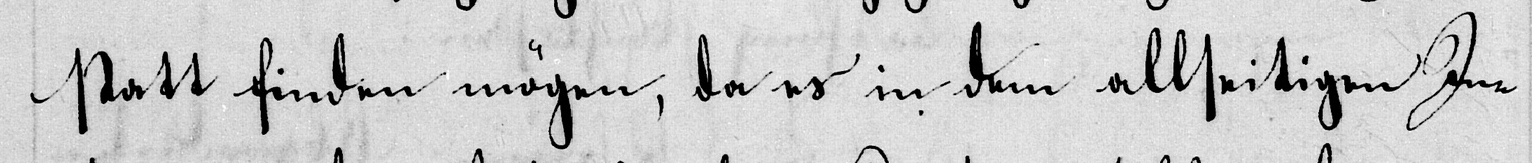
statt finden mögen, da es in dem allseitigen In¬
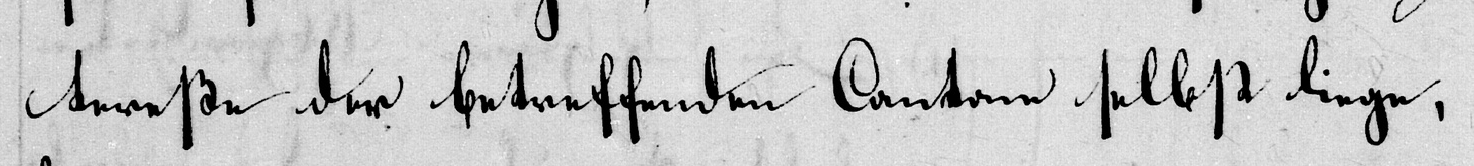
tereße der betreffenden Cantone selbst liege,
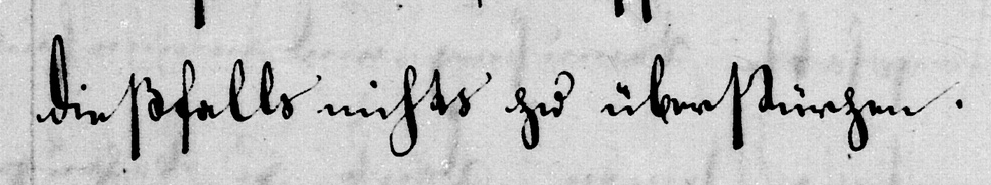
dießfalls nichts zu überstürzen.
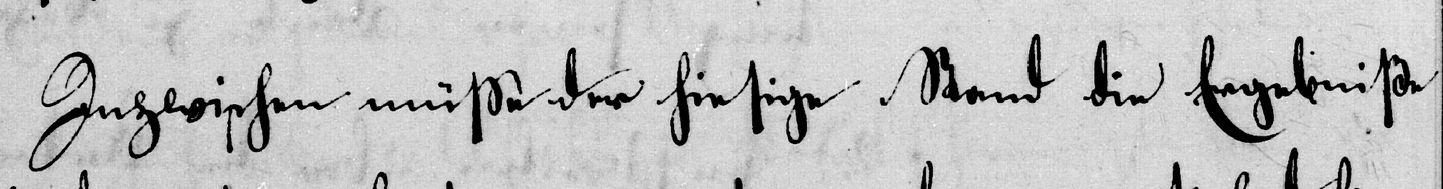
Inzwischen müße der hiesige Stand die Ergebniße
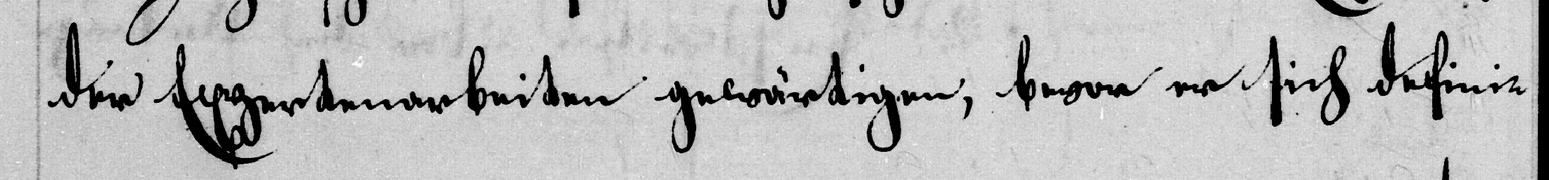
der Expertenarbeiten gewärtigen, bevor er sich defini-
